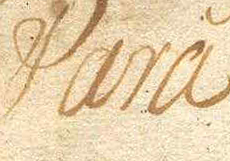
Pará
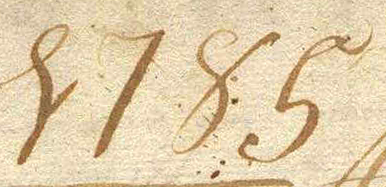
1785
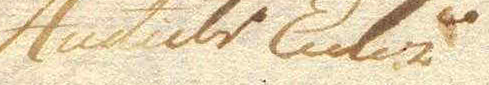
Audictr.o Ecclez.co
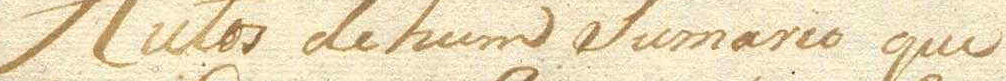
Autos de hum sumario que
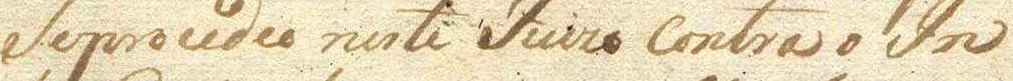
se procedeo neste Iuizo contra o In
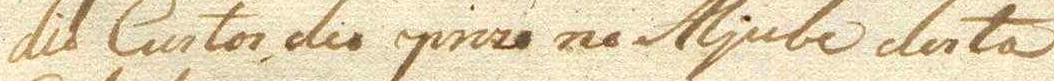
dio Custodio prezo no Aljube desta
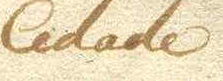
Cidade
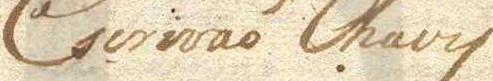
Escrivaõ Chaves
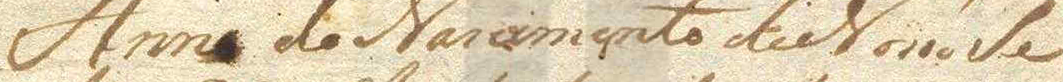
Anno do Nascimento de Nossa Se
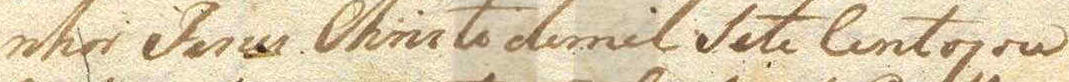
nhor Jesus Christo de mil SeteCentos ou
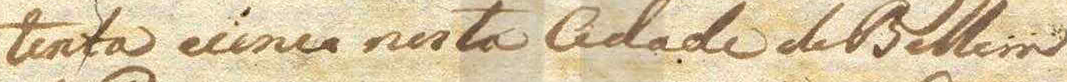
tenta e cinco nesta Cidade de Bellem
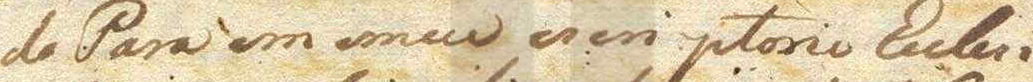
do Pará em meu escriptorio Ecclezi
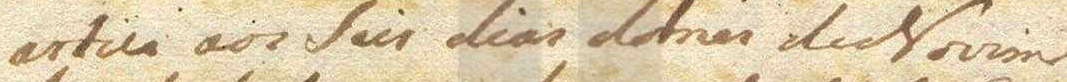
astico aos seis dias do mes de Novem
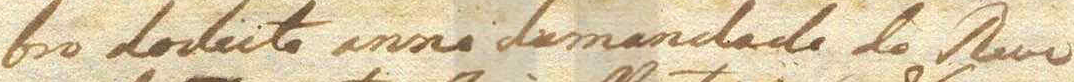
bro do dicto anno do mandado do Reve
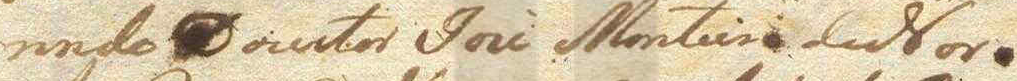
rendo Doutor Iozé Monteiro de Noro
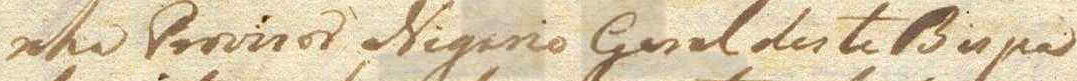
nha Provisor Vigario Geral deste Bispa
